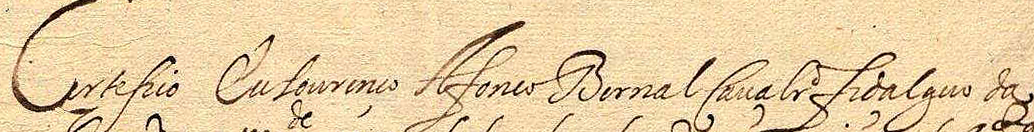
Certefico eu lourenço Afonso Bernal Caualro fidalguo da
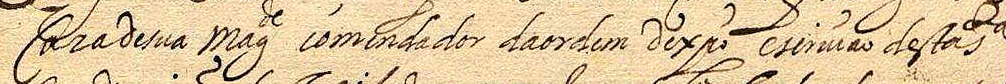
Caza de sua magde comendador da ordem de xpō escriuão desta sta
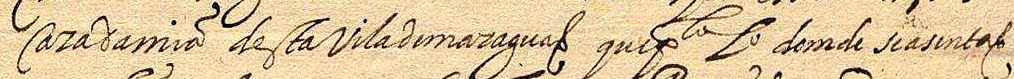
Caza da miā desta Vila de mazaguaõ que plo Lo domde se asentaõ
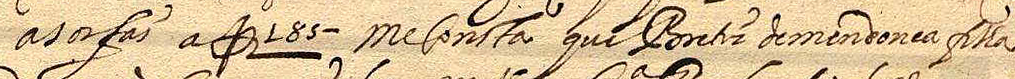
as orfas̄ a fl 185 me Consta que Bretiz̄ de mendonça filha
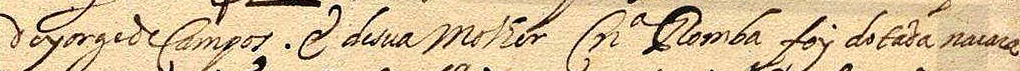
de yorge de Campos. E de sua molher Cna Romba foy dotada na caza
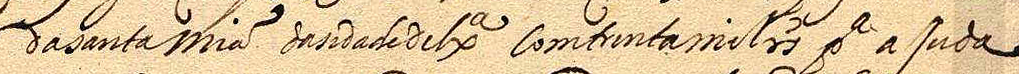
da santa miā da sidade de lxa com trinta mil rs̄ pa aJuda
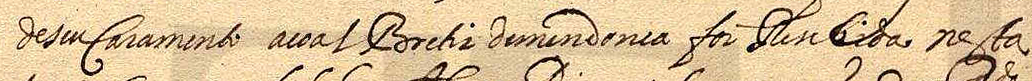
de seu Cazamento a coal Bretiz de mendonça foi Resebida nesta
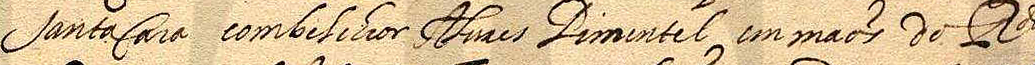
Santa Caza com belchior Alures Pimentel em maõs do Rdo
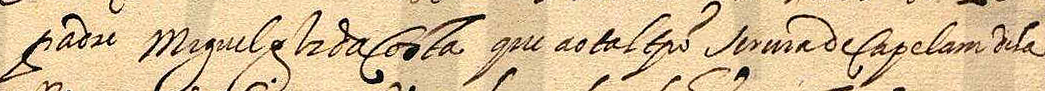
padre Miguel Glz da Costa que ao tal tpō seruia de Capelam dela
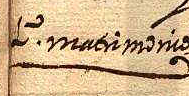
1o. matrimonio
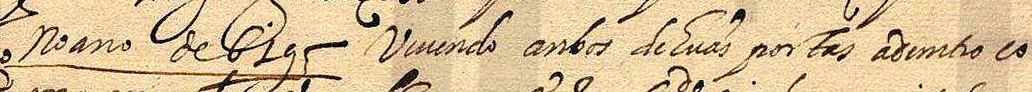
no ano de 6i9 - Viuendo anbos de huas̄ portas ademtro co
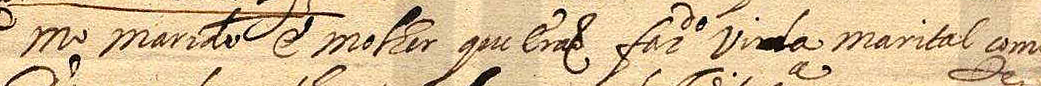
mo marido e molher que eraõ fazdo vida marital como
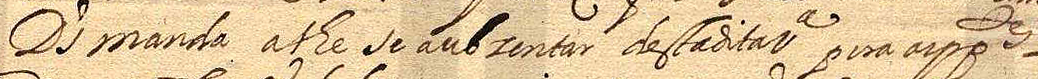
Ds̄ manda athe se aubzentar desta dita va pera as pptes
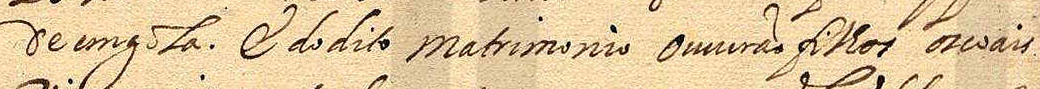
de emgola. E do dito matrimonio ouuerão filhos os coais
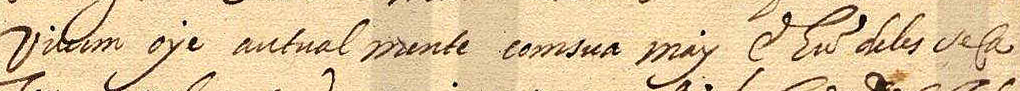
Viuem oye autualmente com sua may e hū deles se Ca
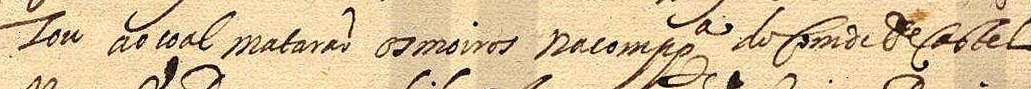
Zou ao coal mataraõ os moiros na comppa do Comde de Castel
